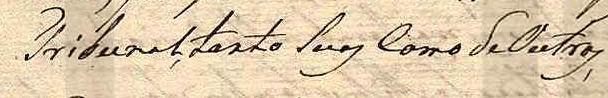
Tribunal, tanto Suas Como de Outros,
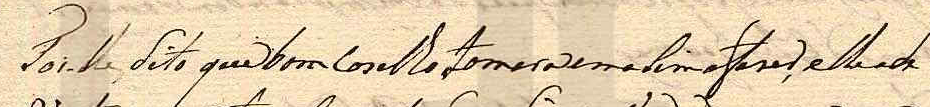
Foi- lhe dito que bom Coselho tomara em asim o fazer, e lhe ade
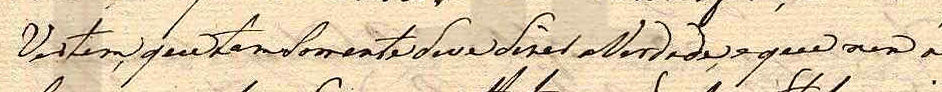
Vertem, que tam Somente deve dizer a Verdade, e que nem a
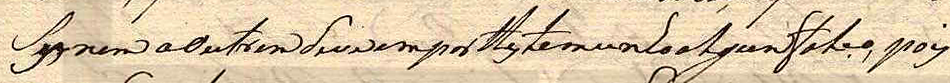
Sy nem a Outren deve empor thestemunho algum falço, pois
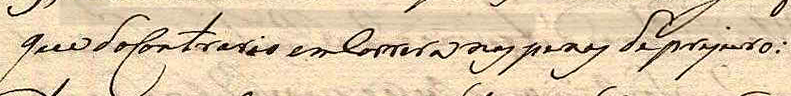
que do Contrario emCorrera nas penas de prejuro:
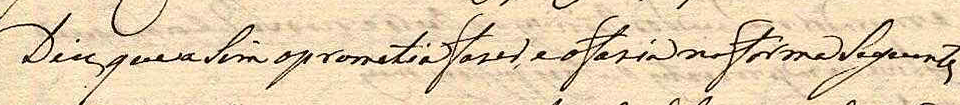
Dice que asim o prometia fazer, e o fazia na forma Seguinte
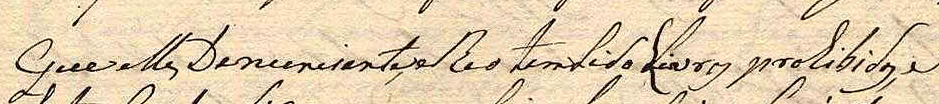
Que elle Denunciante Reo tem lido Livros prohibidos, e
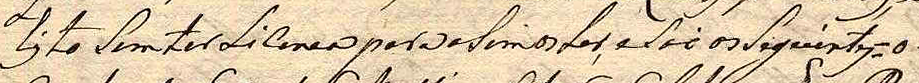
histo Sem ter Licença para aSim os Ler, e saõ os Seguintes=o
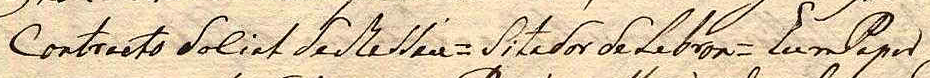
Contracto SoCial de Rassau= Sitador de Lebron= hum Paper
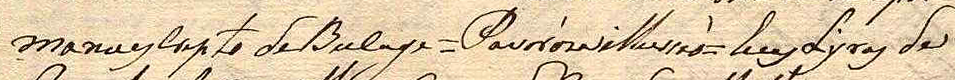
manuesCrepto de Bucage= Pavoroza illussaõ= huas Lyras de
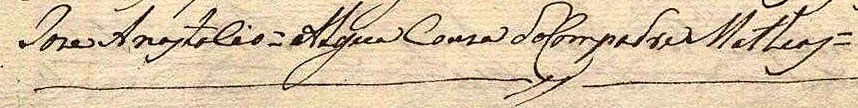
Ioze AnastaCio = Algua Couza do Compadre Matheos
